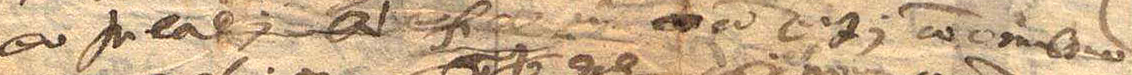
e o treladej bē e fielmte e cōcertej cō o mesmo
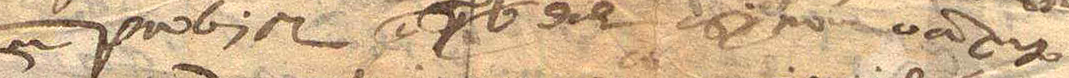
sor̄ provjsor q̄ p̄ ꝟdade asynou o cōçerto
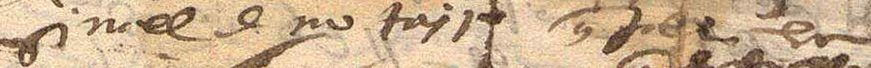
sinall de notajro q̄ tall he
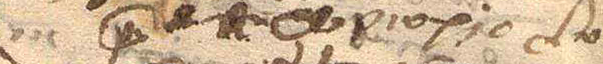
p̄g deste e do propio cēto
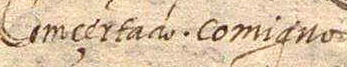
Comçertado. comiguo
